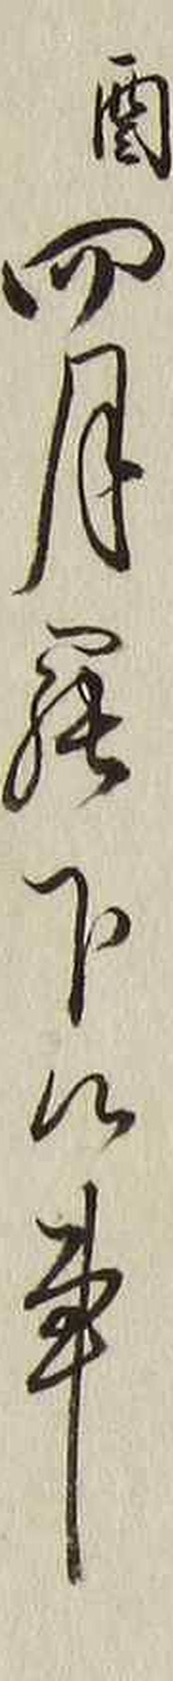巳正月罷下候事
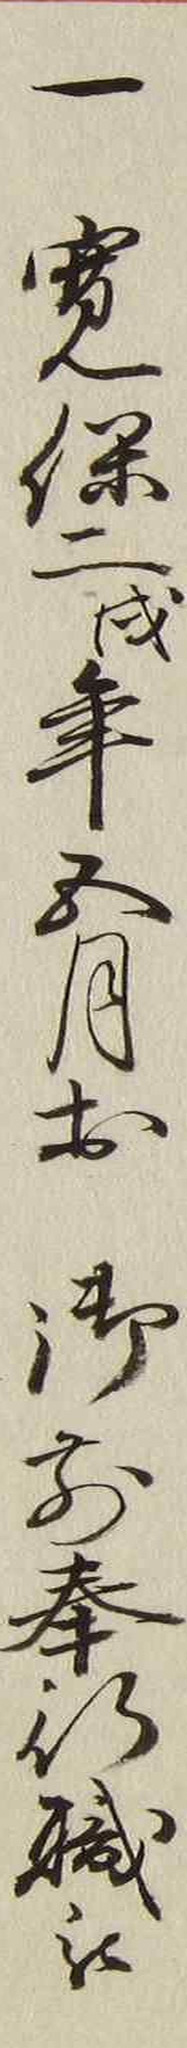一寛保二戌年五月於御前奉行職被
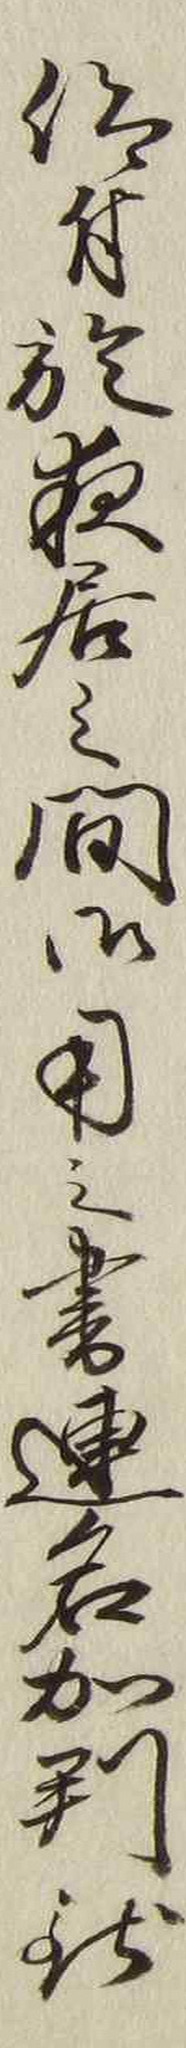仰付於夜居之間御用之書連名加判致
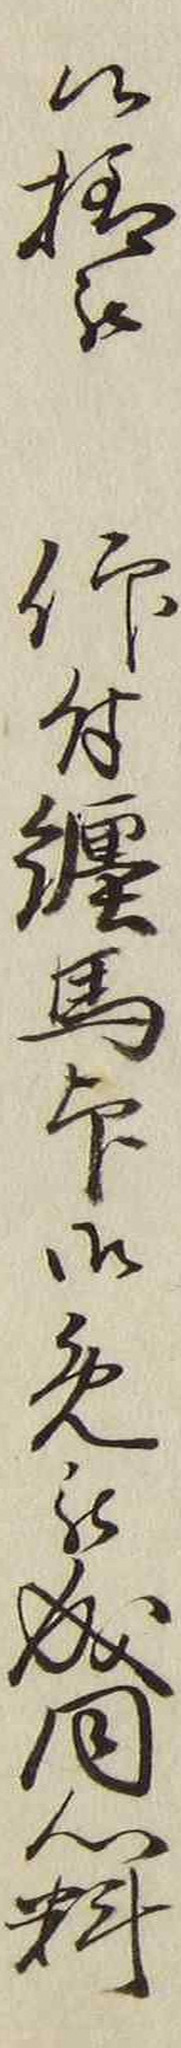候様被仰付纏馬印御免被成同心料

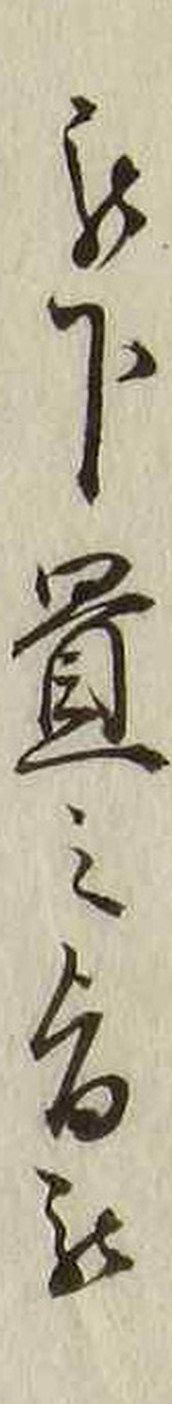被下置之旨被仰出候事
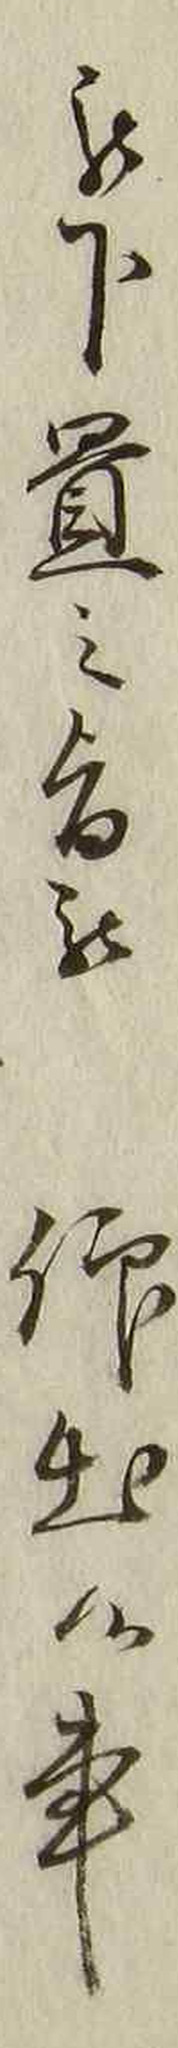被下置之旨被仰出候事
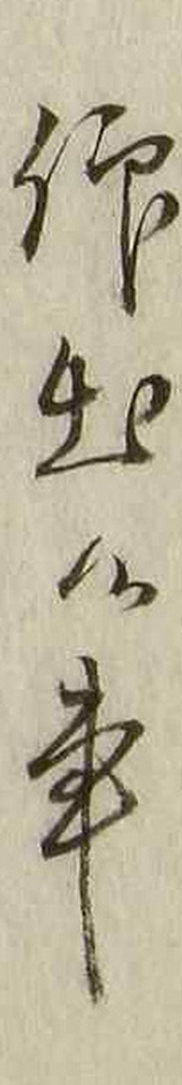仰出候事
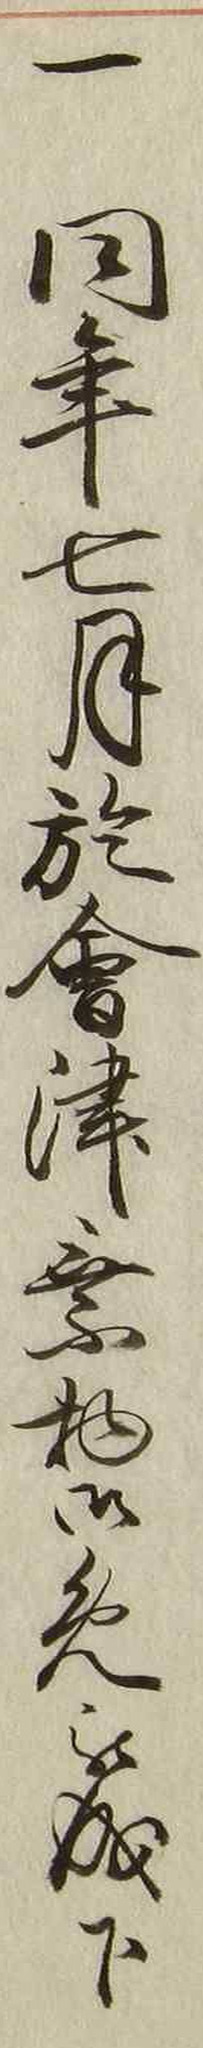一同年七月於会津乗物御免被成下
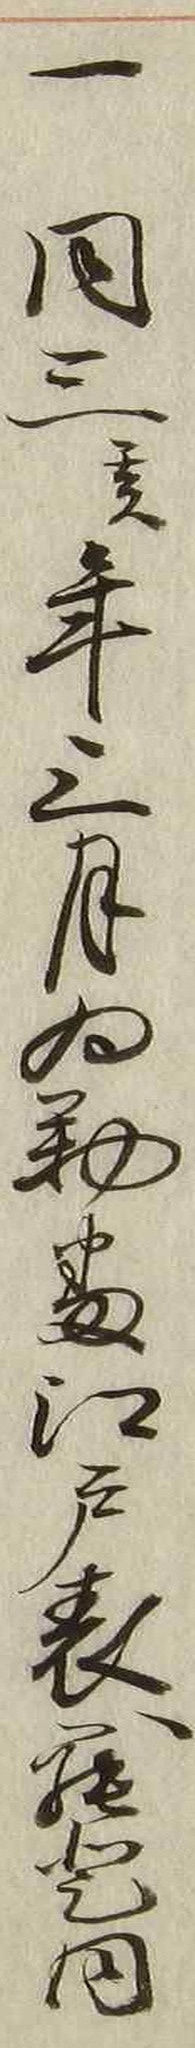一同三亥年三月為勤番江戸表へ蔵登同
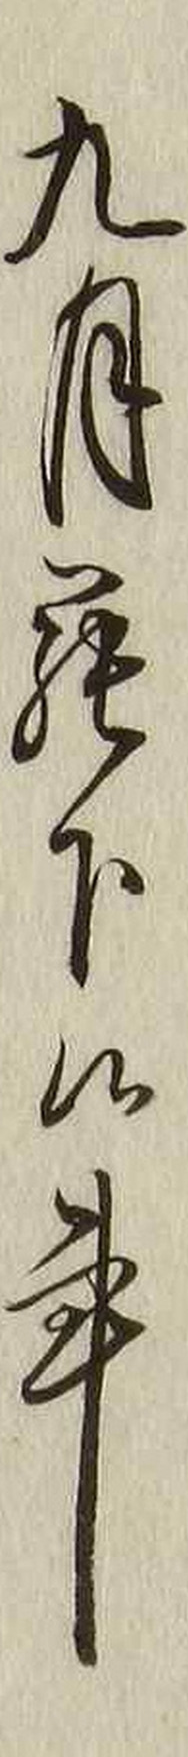九月罷下事候
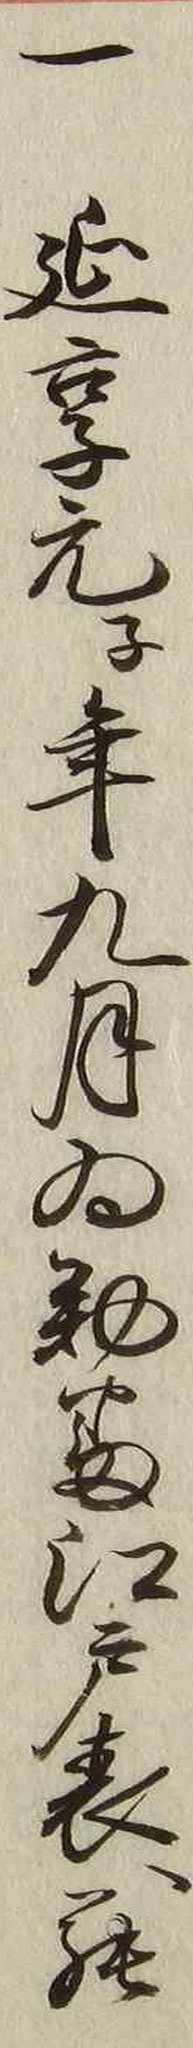一延享元子年九月為勤番江戸表へ罷
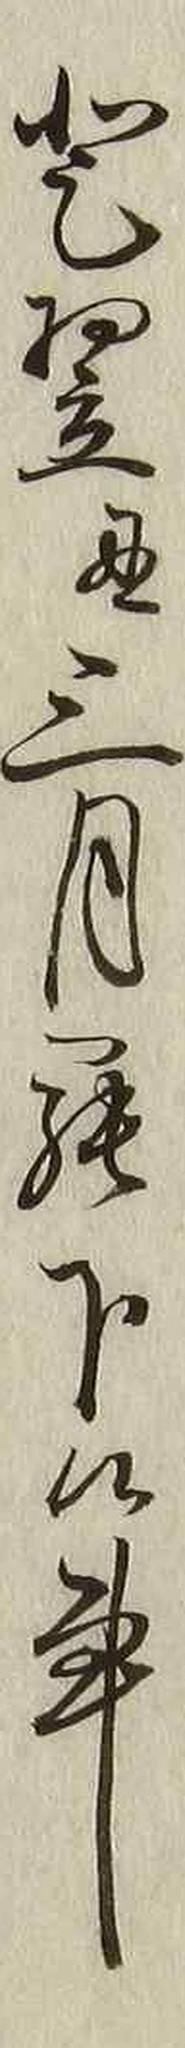登翌丑三月罷下候事
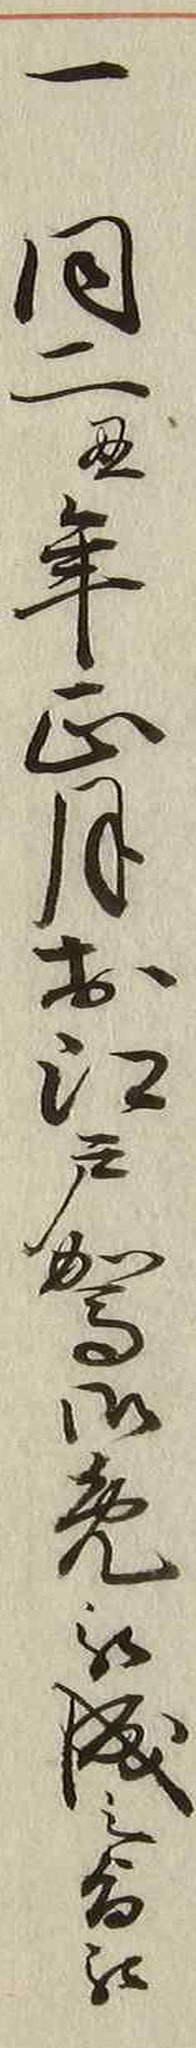一同二丑年正月於江戸駕御免被成之旨被
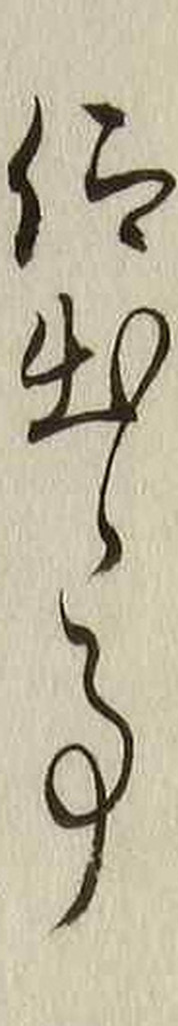仰出候事
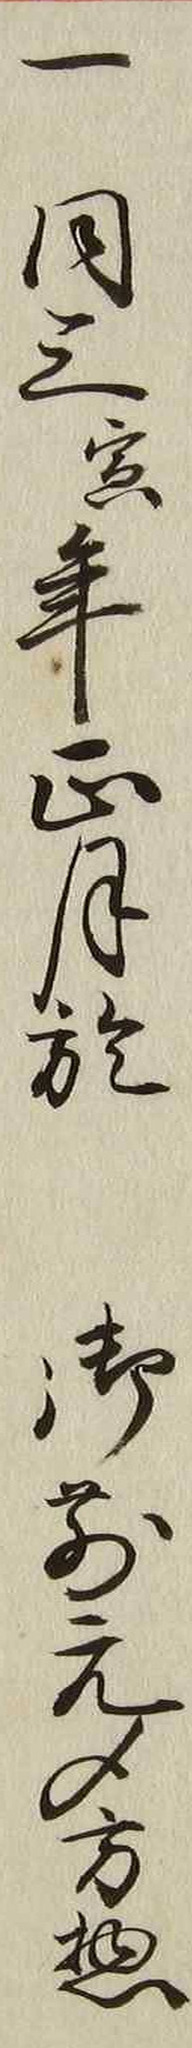一同三寅年正月於御前元〆方惣
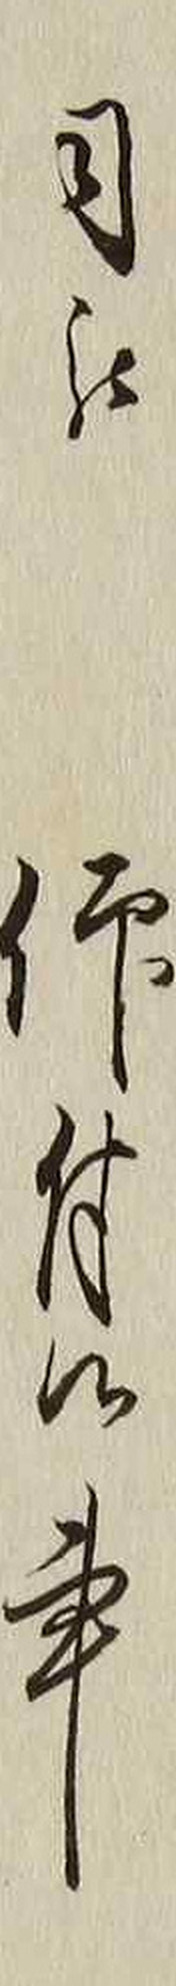司被仰付候事
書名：諸士系譜　巻之21　い之部21
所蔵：会津若松市立会津図書館
